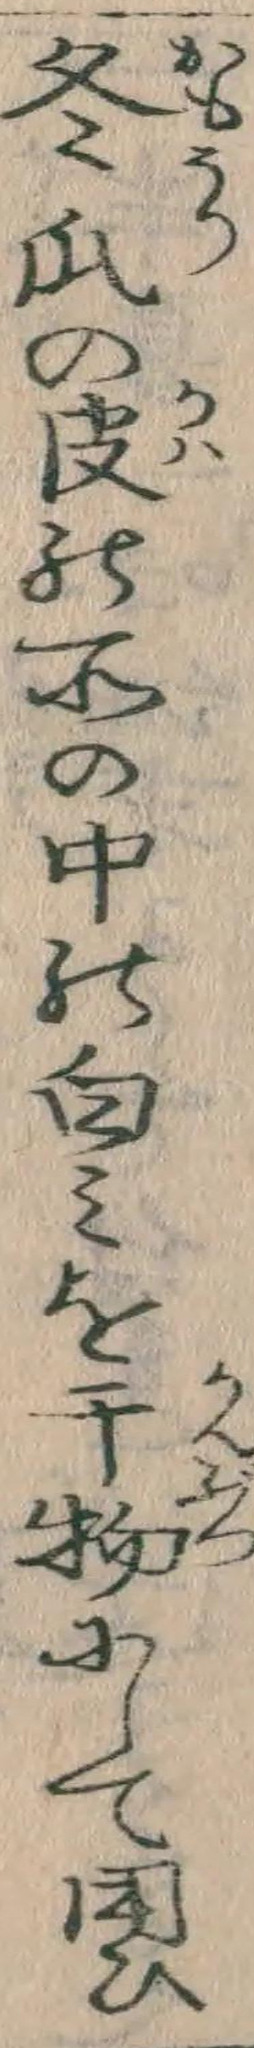冬瓜の皮の所の中の白みを干物にして用ひ
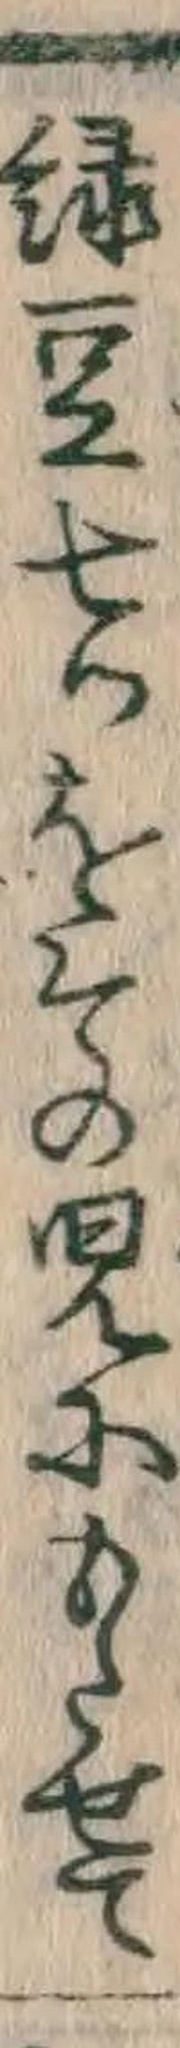緑豆七ッをその児にもたせて
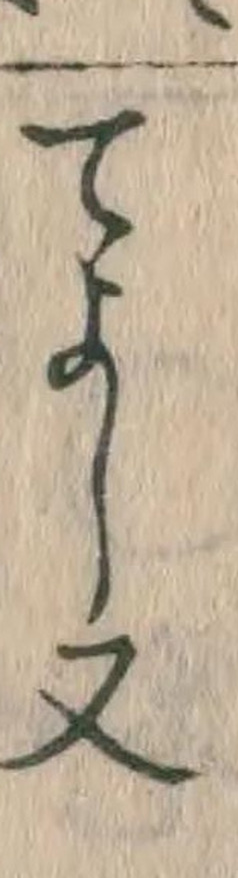てよし又
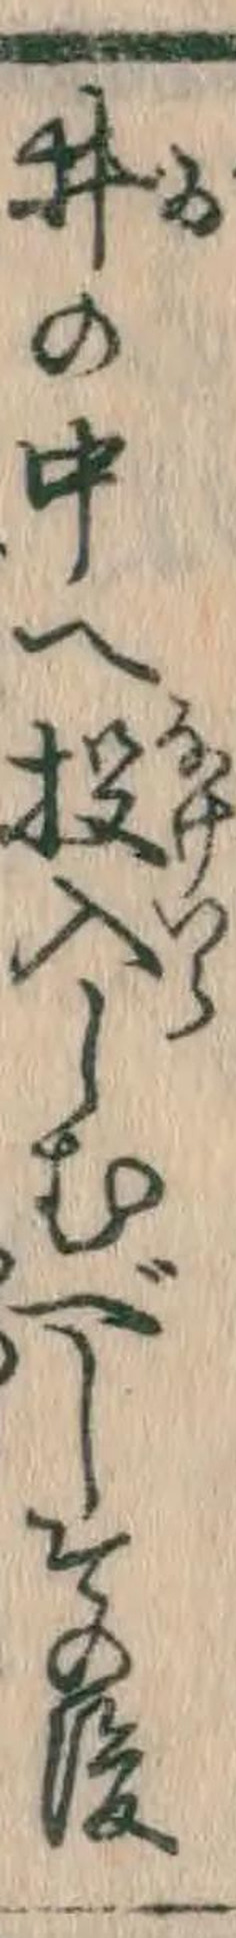井の中へ投入しむべしその後
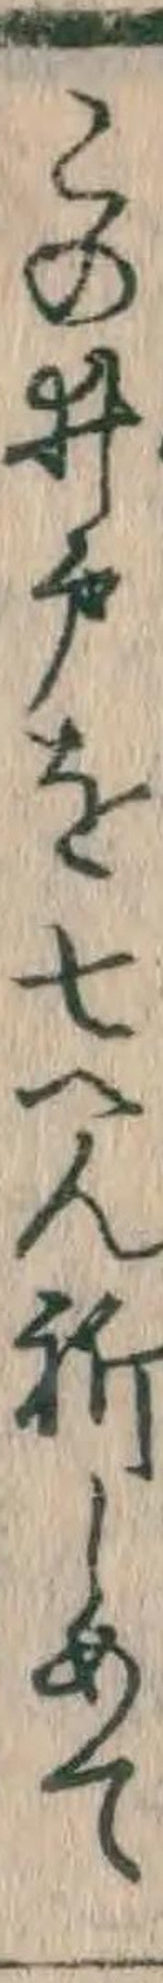この井戸を七へん祈しめて
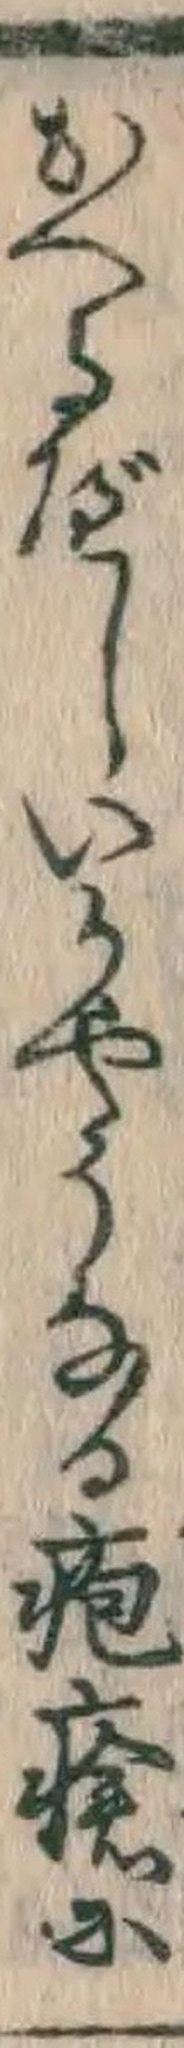かへるべしいかやうなる疱瘡に
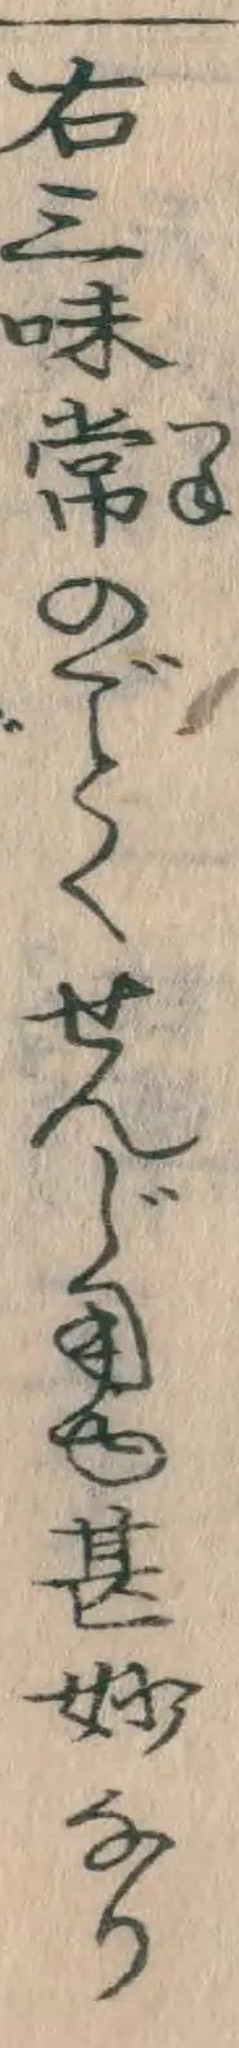右三味常のごとくせんじ用ゆ甚妙なり
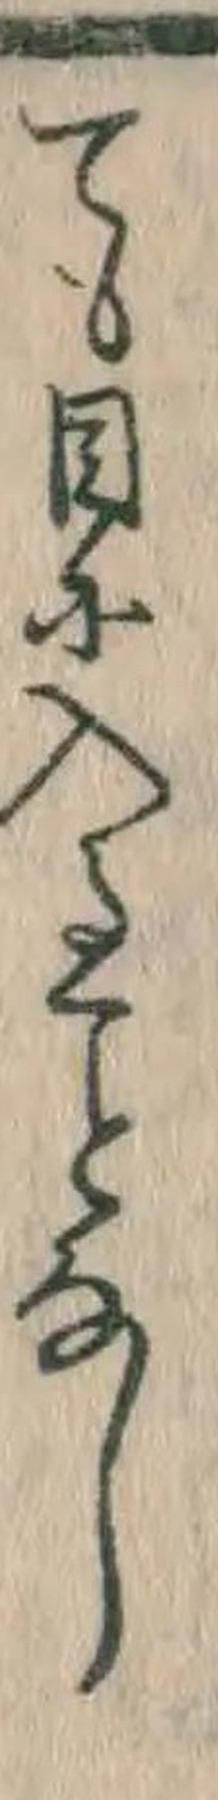ても目に入ることなし
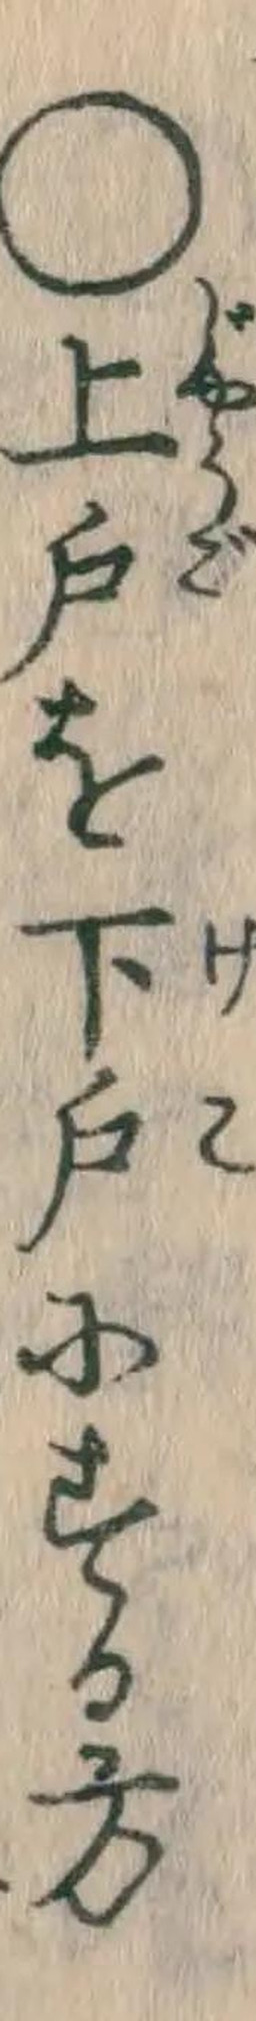○上戸を下戸にする方
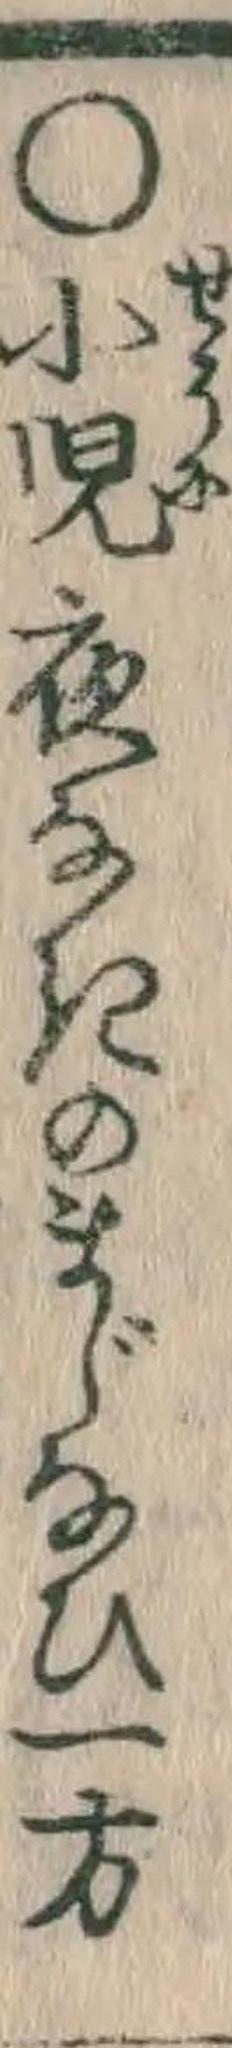○小児夜なきのまじなひ一方
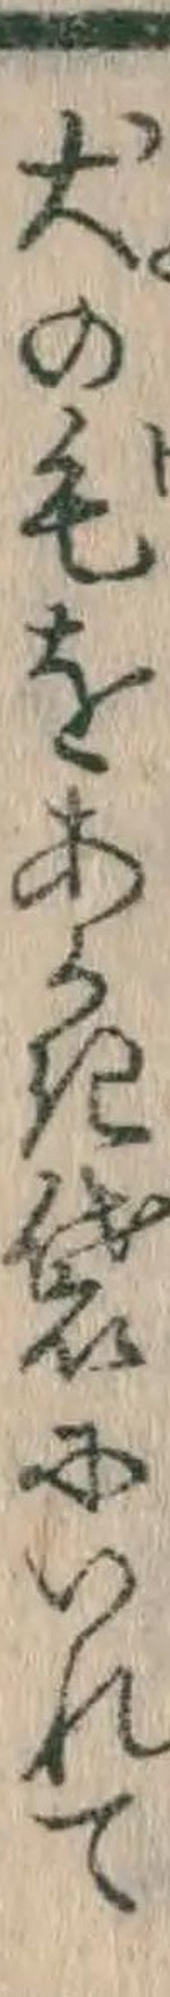犬の毛をあかき袋にいれて
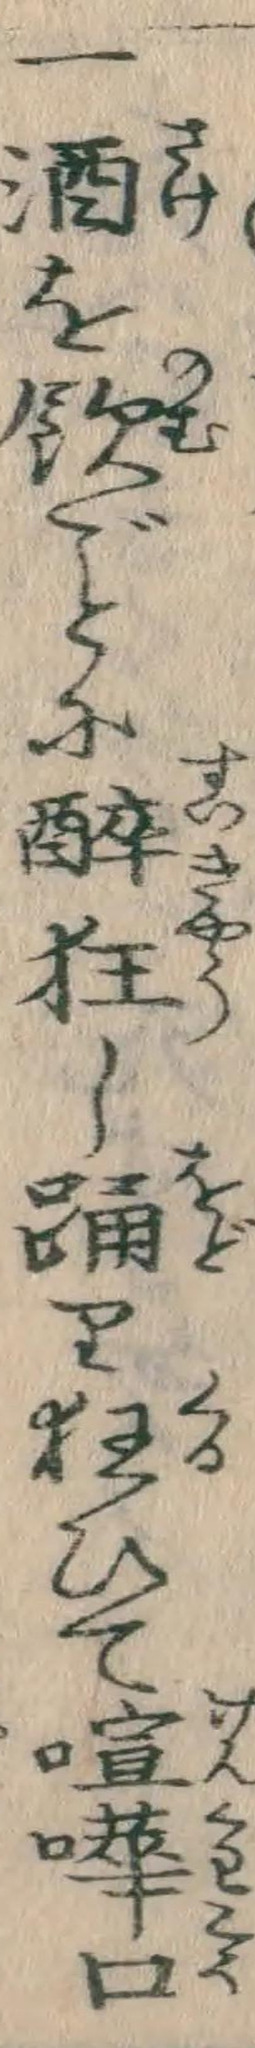一酒を飲ごとに酔狂し踊り狂ひて喧嘩口
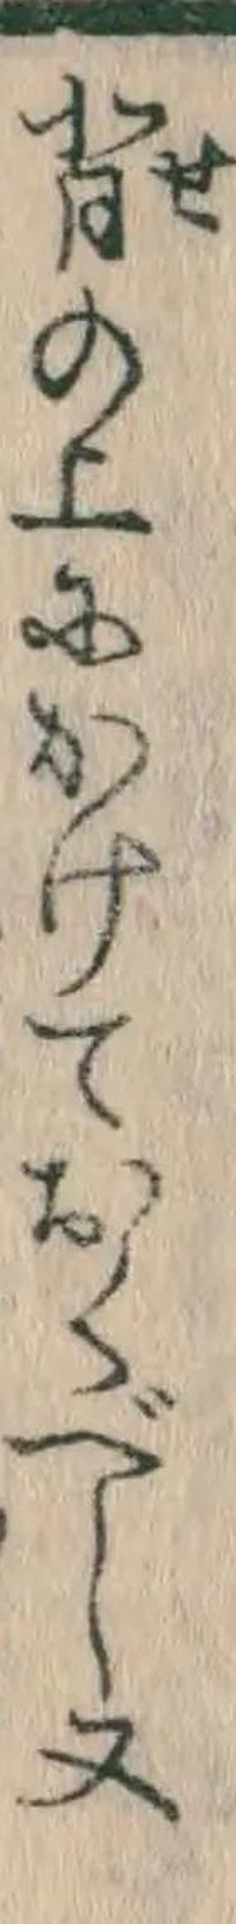背の上にかけておくべし又
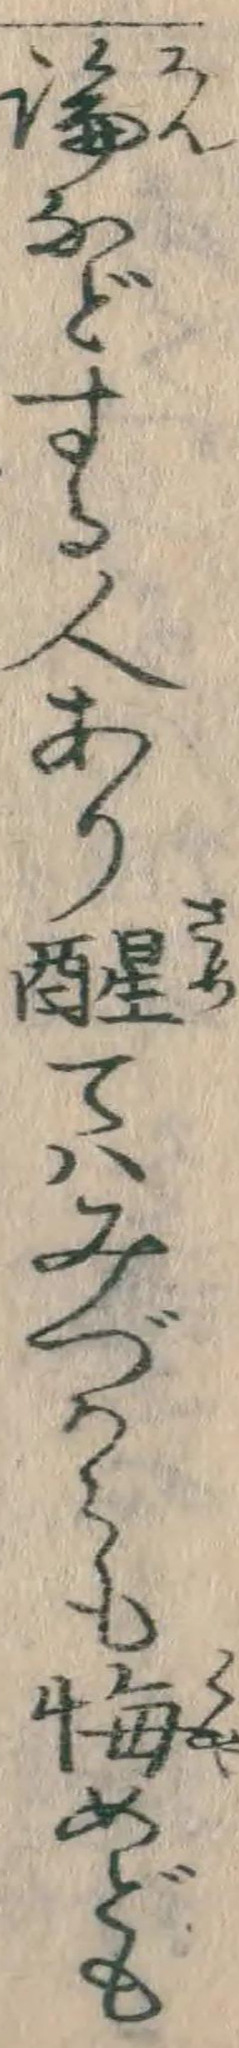論などする人あり醒てはみづからも悔めども
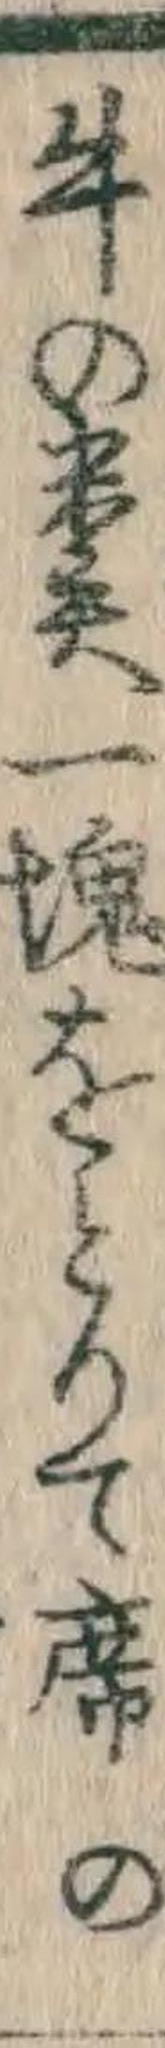牛の糞一塊をとりて席の
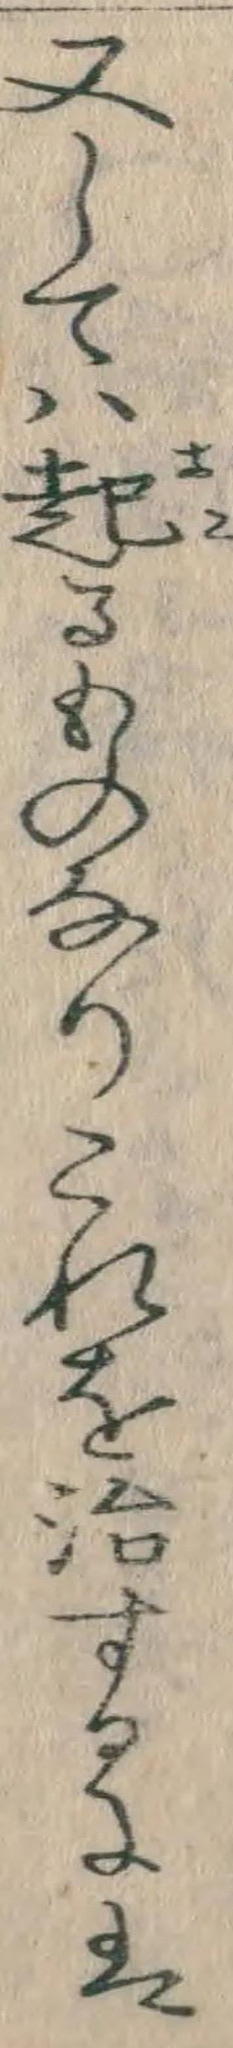又しては起るものなりこれを治するには
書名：広益秘事大全 3巻. [4]
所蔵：国立国会図書館 National Diet Library, JAPAN
